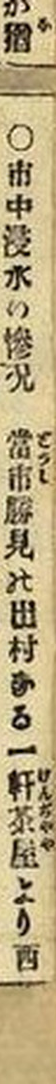○市中浸水の惨況当市勝見の出村なる一軒茶屋より西
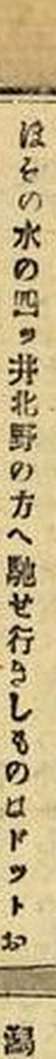ほその水の四ッ井北野の方へ馳せ行きしものはドットお
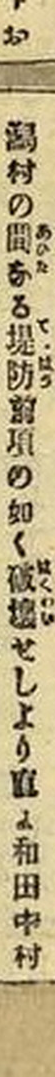潟村の間なる堤防前項の如く破壊せしより直に和田中村
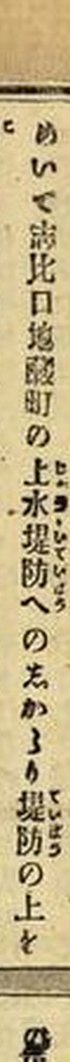めいて志比口地蔵町の上水堤防へのしかゝり堤防の上を
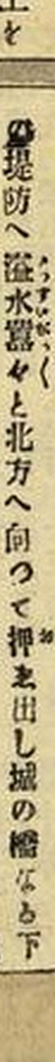の堤防へ溢水囂々と北方へ向つて押し出し城の橋なる下
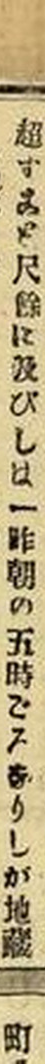超すこと尺余に及びしは一昨朝の五時ごろなりしが地蔵
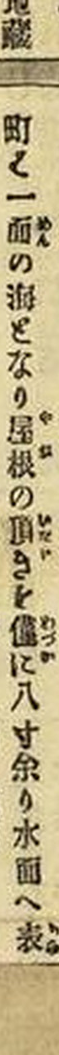町は一面の海となり屋根の頂きを僅に八寸余り水面へ表
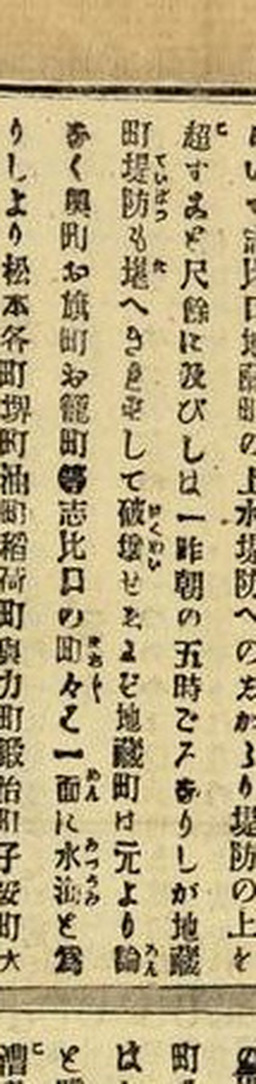町堤防も堪へきれずして破壊せしにぞ地蔵町は元より論
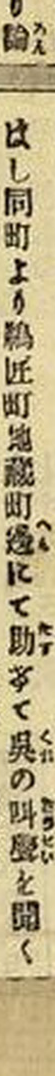はし同町より鵜匠町地蔵町辺にて助けて呉の叫声を聞く
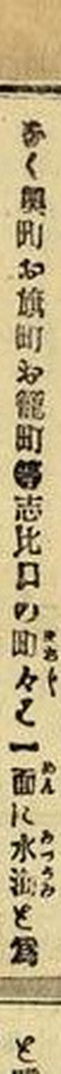なく奥町お旗町お籠町等志比口の町々は一面に水海と為
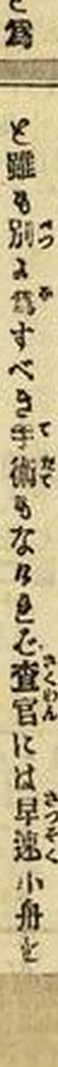と雖も別に為すべき手術もなければ査官には早速小舟を
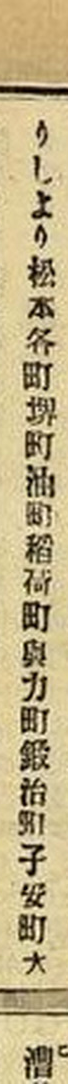りしより松本各町堺町油町稲荷町与力町鍛冶町子安町大
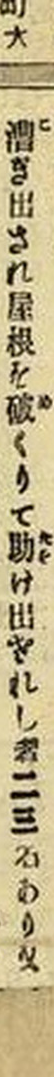漕ぎ出され屋根を破くりて助け出されし者二三名あり又
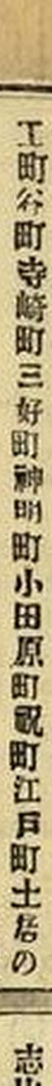工町谷町寺崎町三好町神明町小田原町祝町江戸町土居の
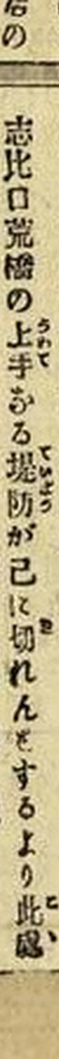志比口荒橋の上手なる堤防が已に切れんとするより此処
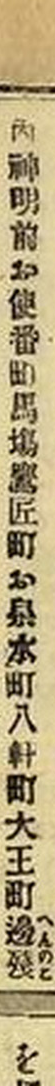内神明前お使番町馬場鷹匠町お泉水町八軒町大王町辺残
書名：温古集 五巻
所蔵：福井県文書館 Fukui Prefectural Archives
